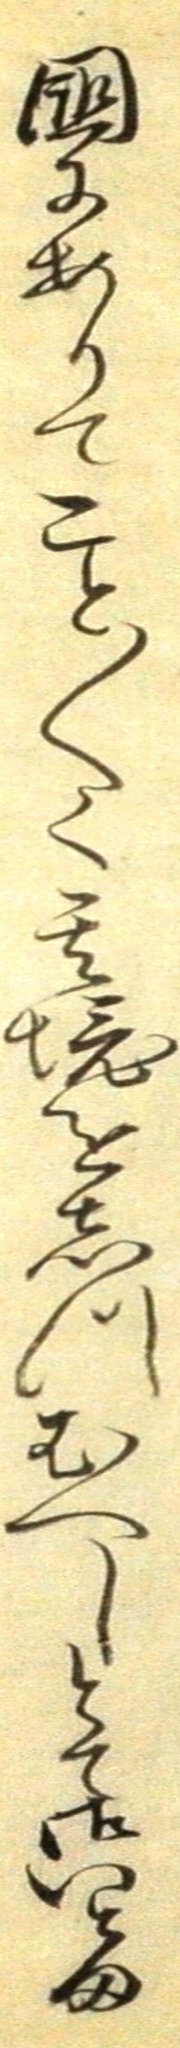国にありてこと〳〵く其境をしつむへしとて御いとま
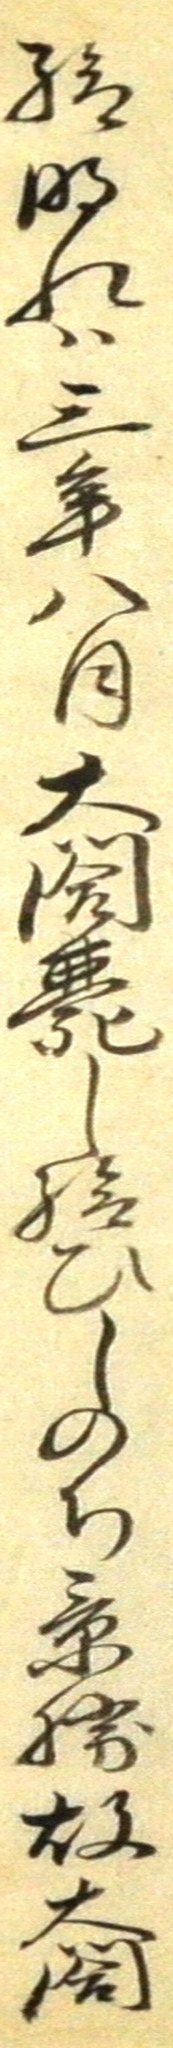給明れは三年八月太閤薨し給ひしのち景勝故大閤
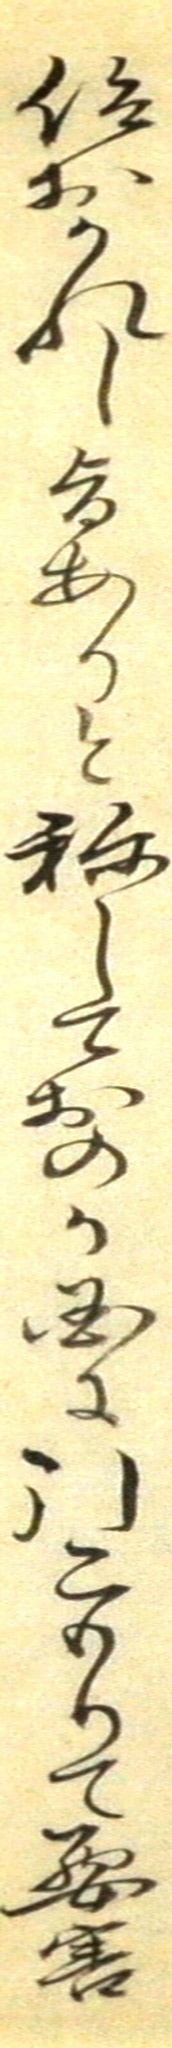仰おかれし旨ありと称しておのか国に引こもりて要害
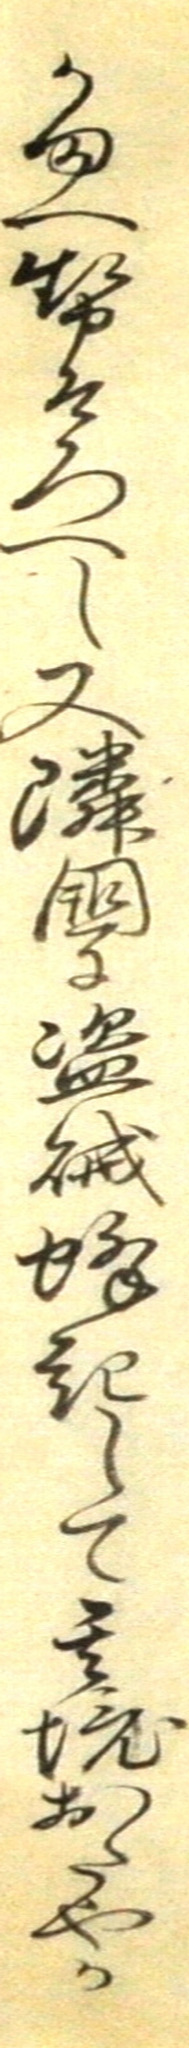かまへ勢そろへし又隣国に盗賊蜂起して其境おたやか
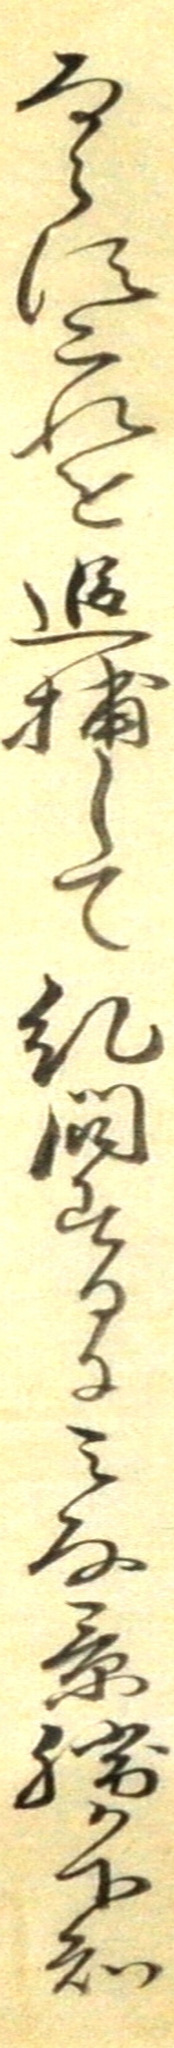ならすこれを追補して糺問するにみな景勝か下知
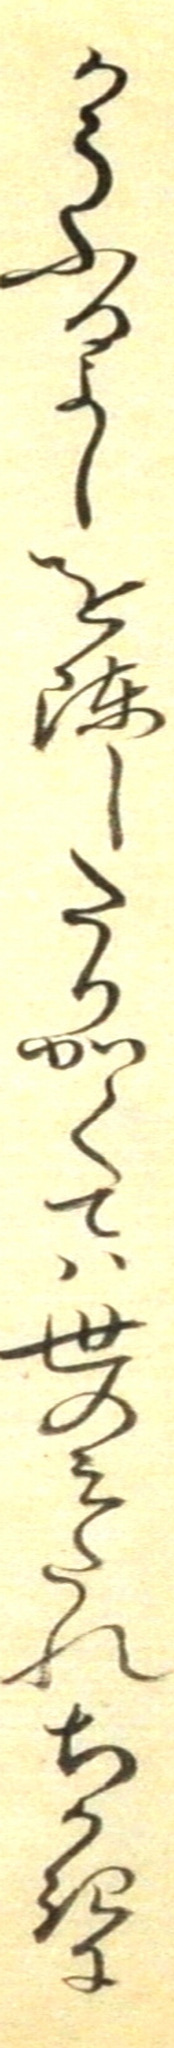かうふるよしを陳したりかくては世のみたれちかきに
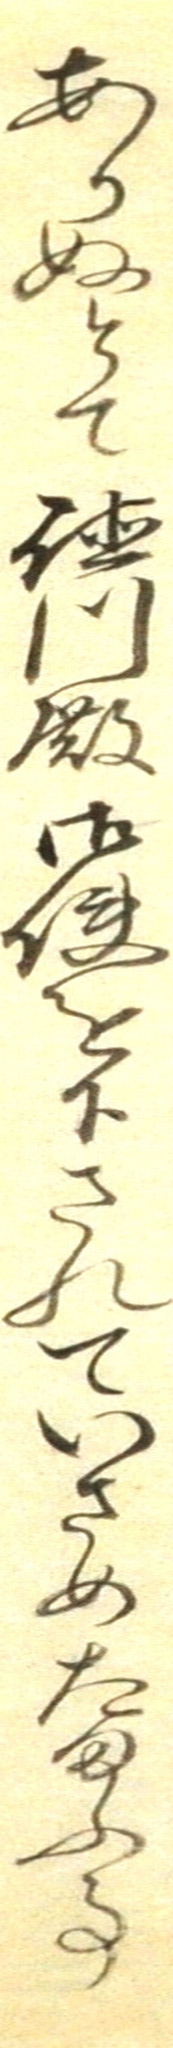ありぬとて徳川殿御使を下されていさめたまふ事
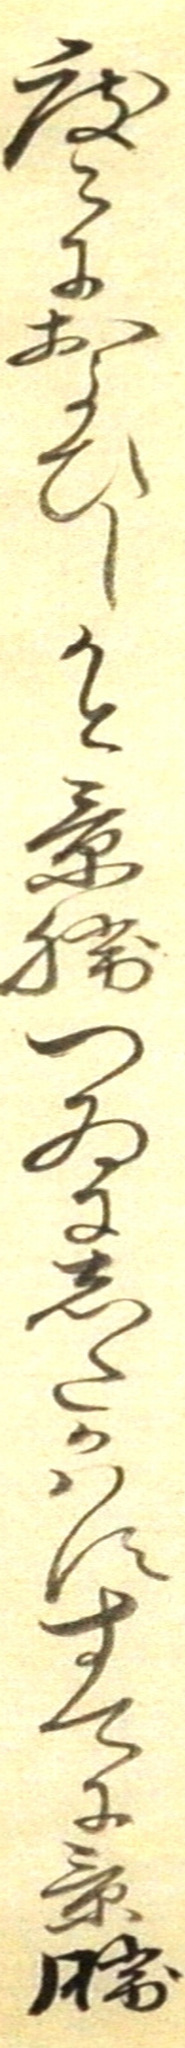度々におよひしかと景勝つゐにしたかはすすてに景勝
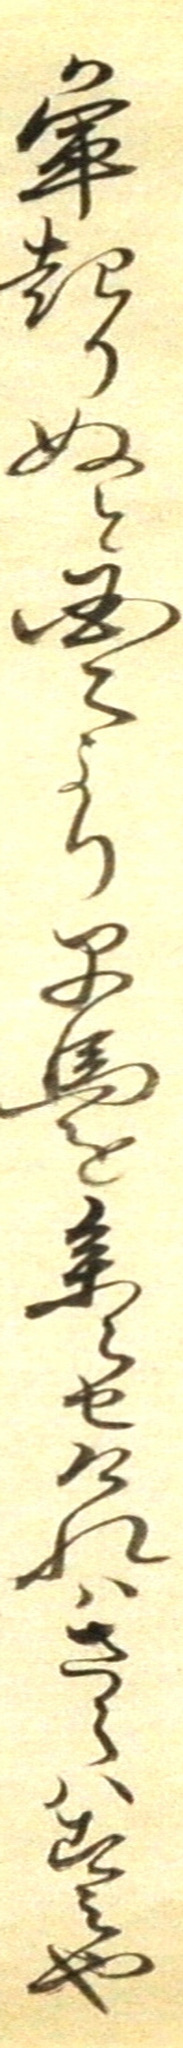か軍起りぬと国々より早馬を参らせけれはさらはすみや
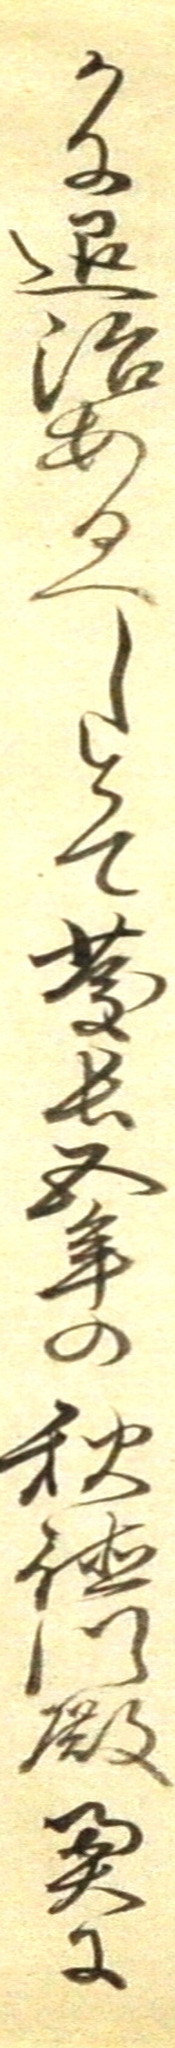かに退治あるへしとて慶長五年の秋徳川殿奥に
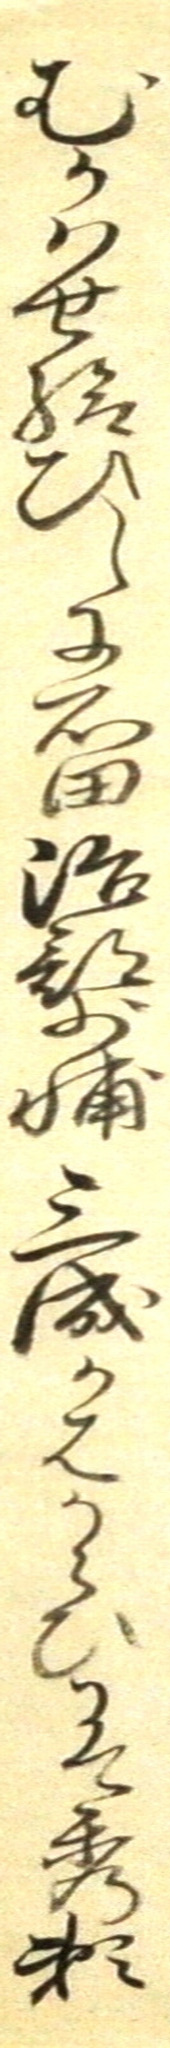むかはせ給ひしに石田治部少輔三成かはからひにて秀頼
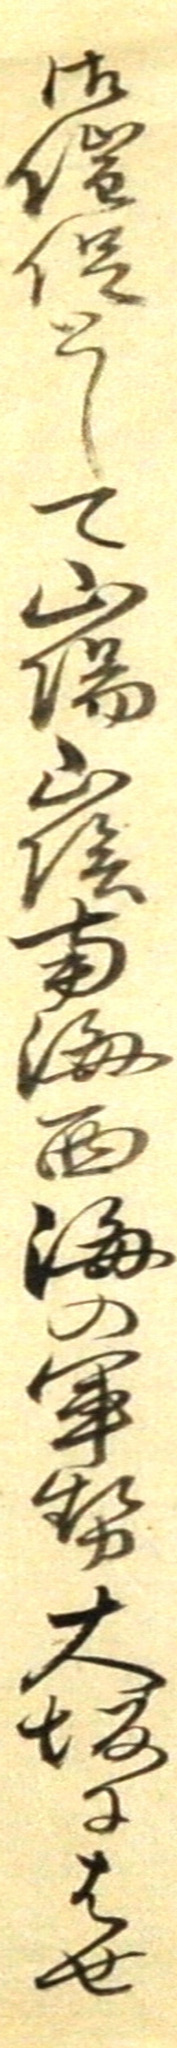御僧侶として山陽山陰南海西海の軍勢大坂にはせ
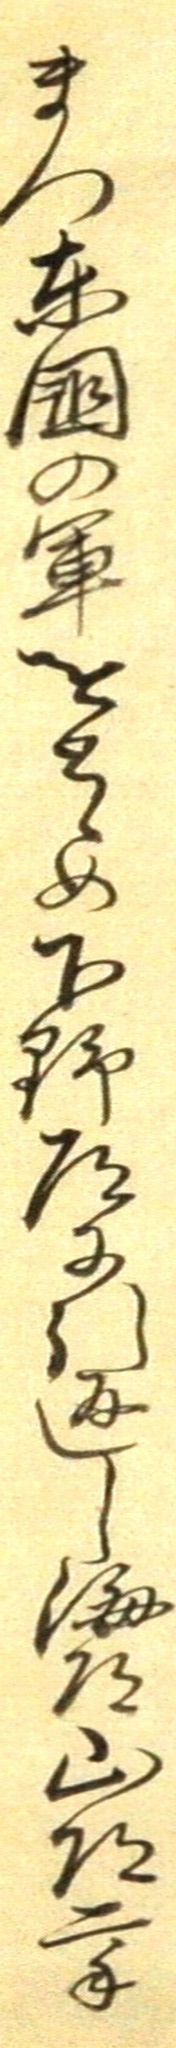まつ東国の軍をとゝめ下野道に引返し海道山道二手
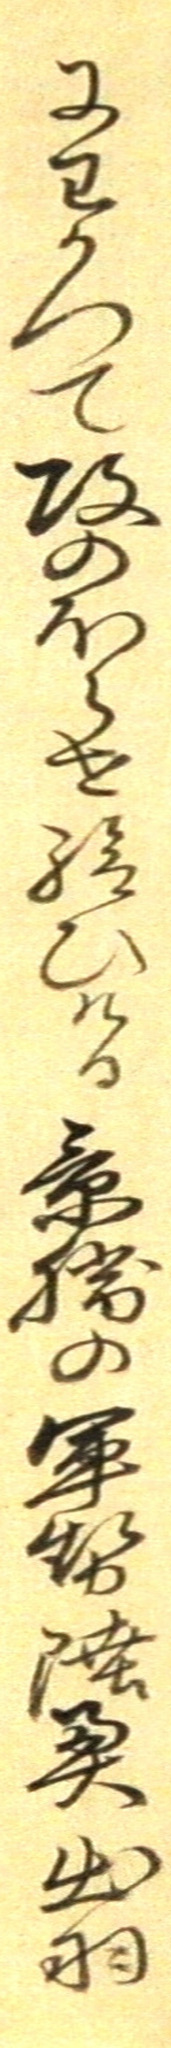にわかつて攻のほらせ給ひける景勝の軍勢陸奥出羽

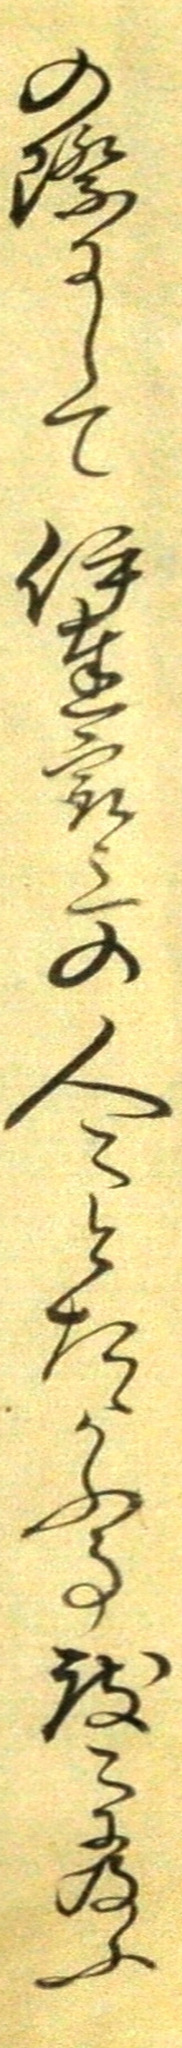の際にして伊達最上の人々とたゝかふ事度々に及ふ
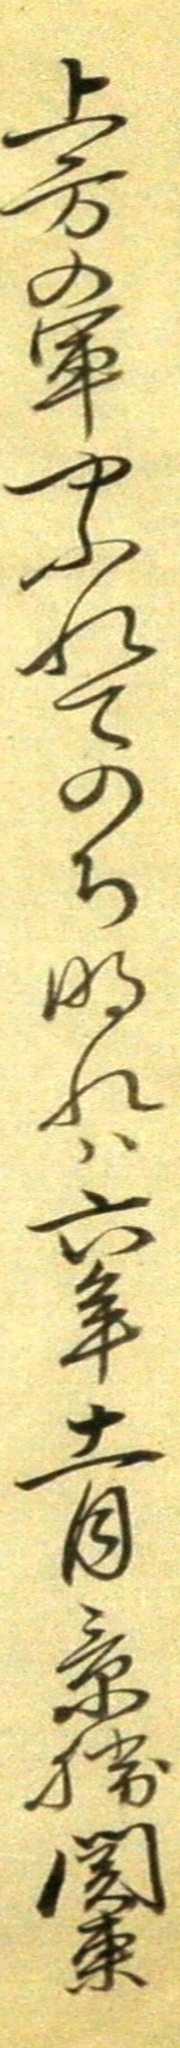上方の軍やふれてのち明れは六年十一月景勝関東
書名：藩翰譜（八・下）
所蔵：伊那市立高遠町図書館・合同会社AMANE
